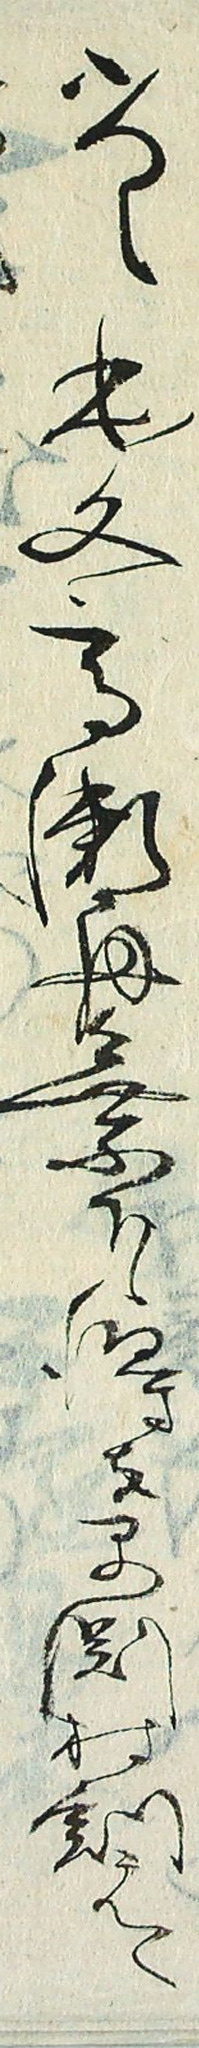尚々本文高瀬舟乗下候組方は早淵村割元へ
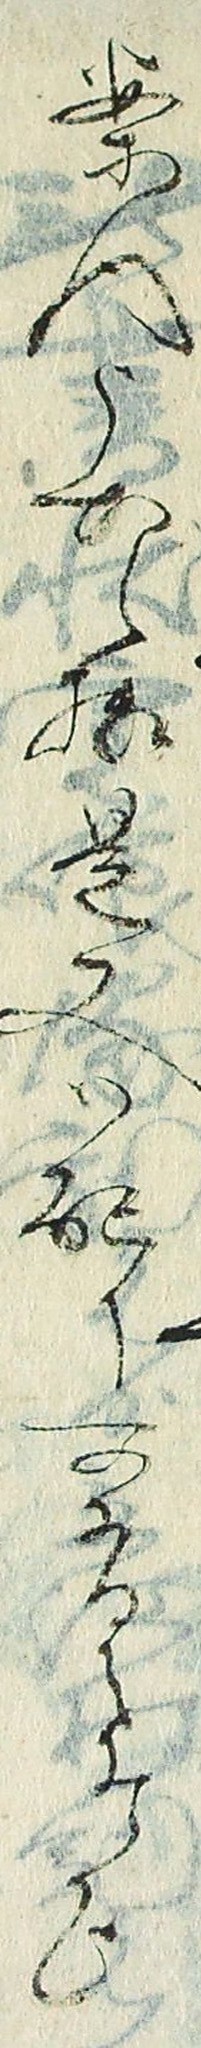案内申出候様是又御配り可有之候以上
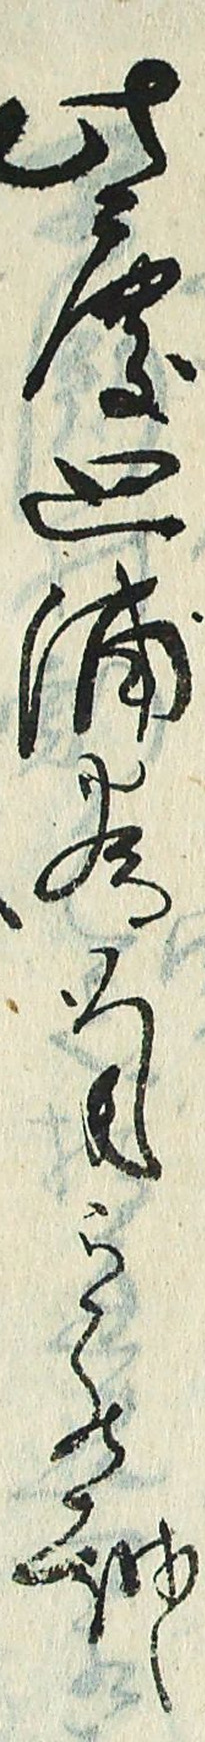此度廻浦為御用被罷越候
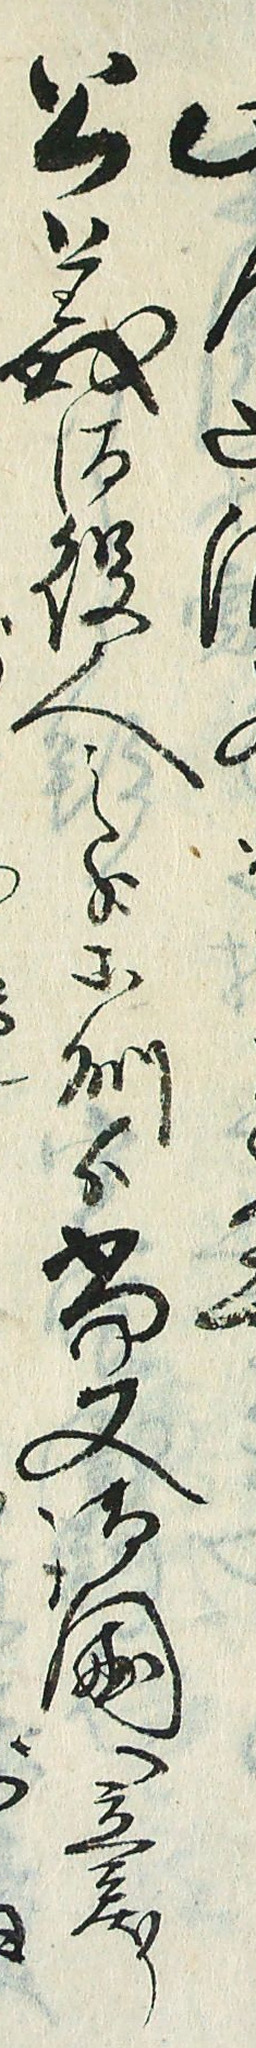公義御役人之義土州ゟ尚又御国へ立戻り
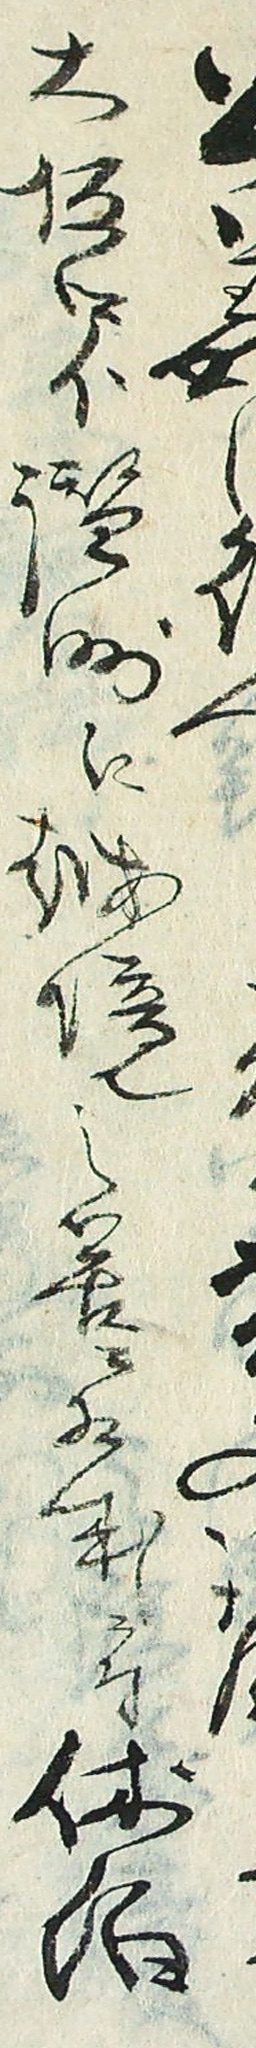大坂口ゟ讃州え越境之筈に相成候に付休泊
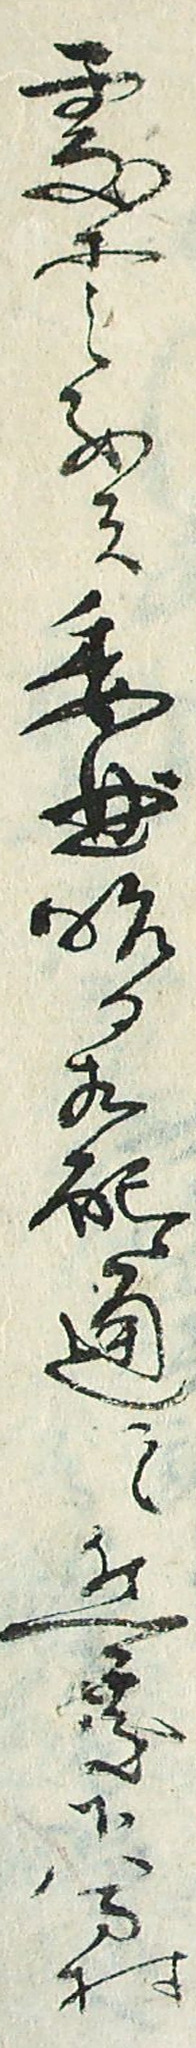処等之義は委曲昨日相配候通に候近処下八万村

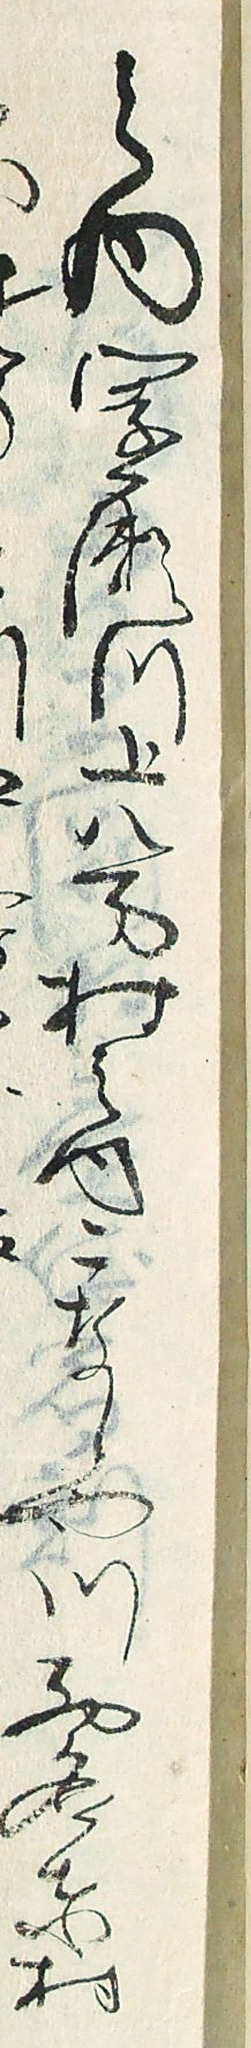之内園瀬川上八万村之内こなしや川西名東村
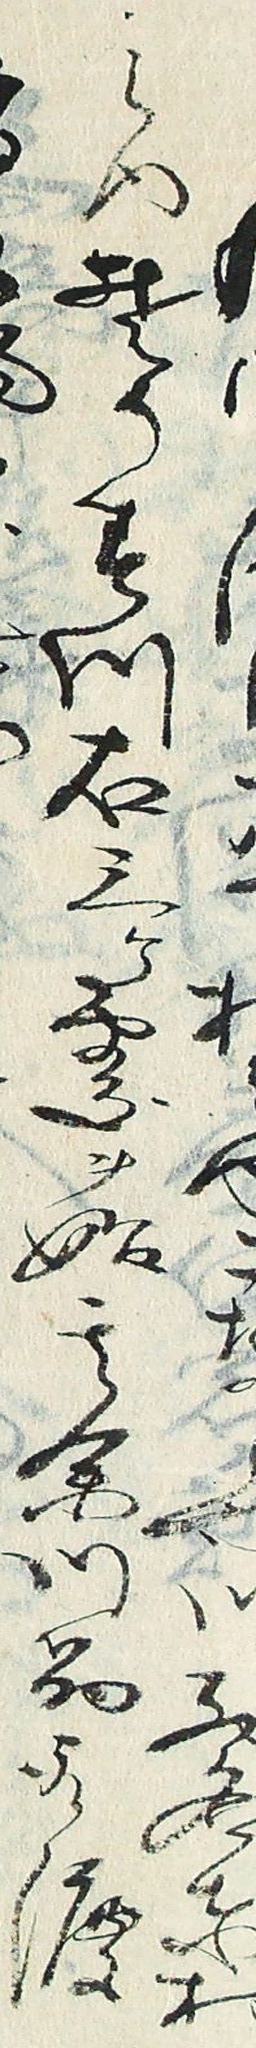之内そかす川右三ヶ処を始其余川筋取渡
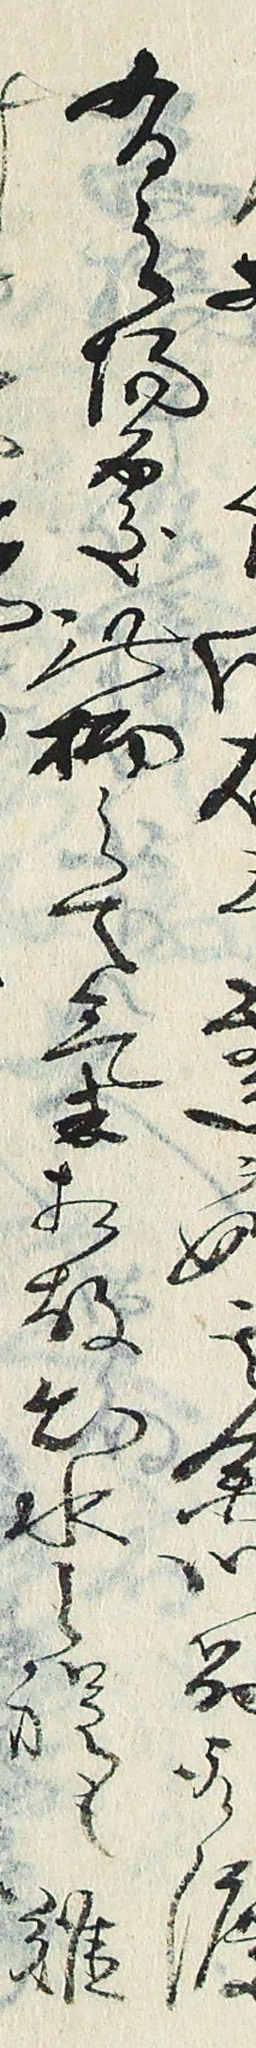有之場処此柄之天気相故出水之程も難
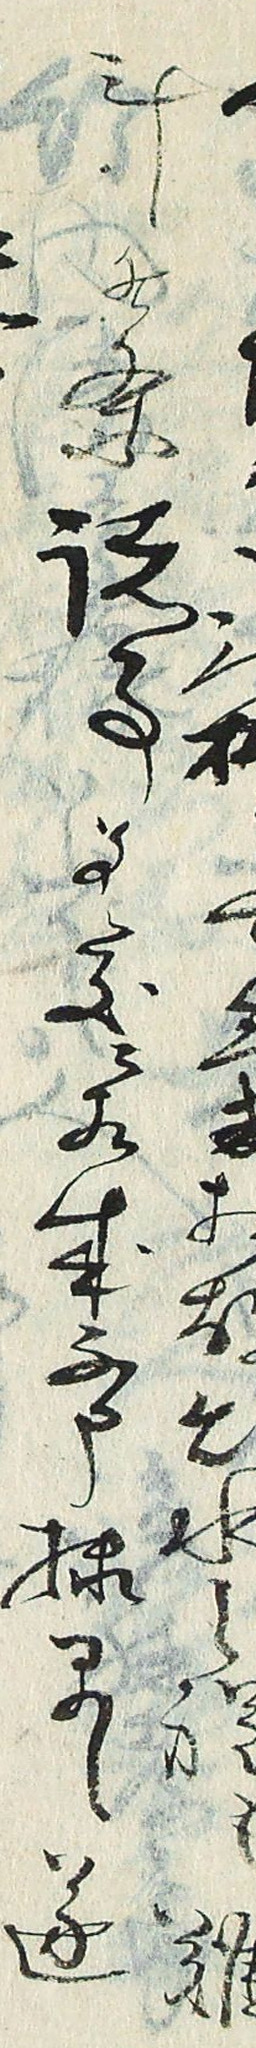計候条諸事差支に相成不申様早々遂
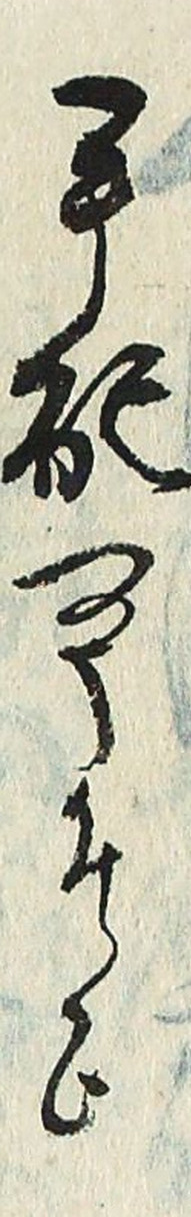手配可申候以上
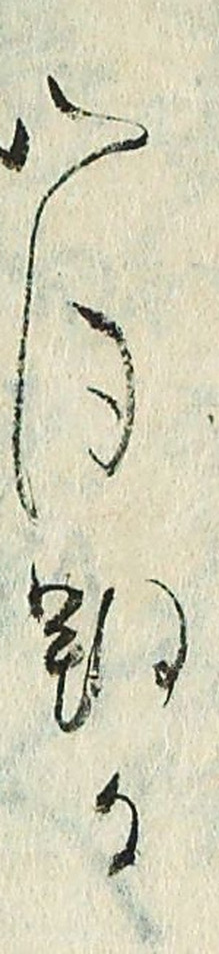八月朔日
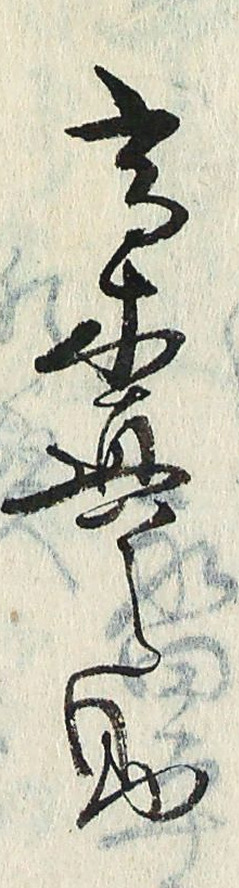高木真之助
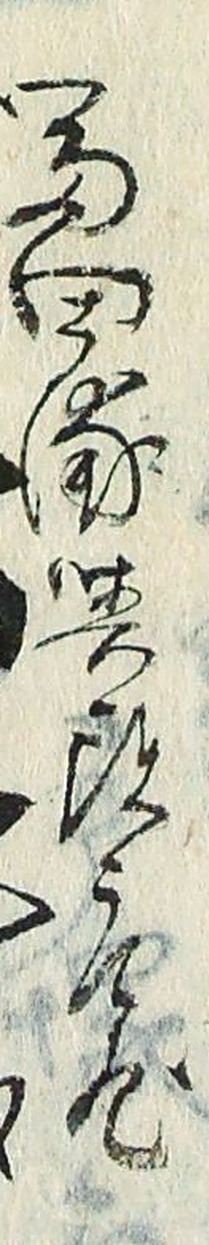富田浦与頭庄屋
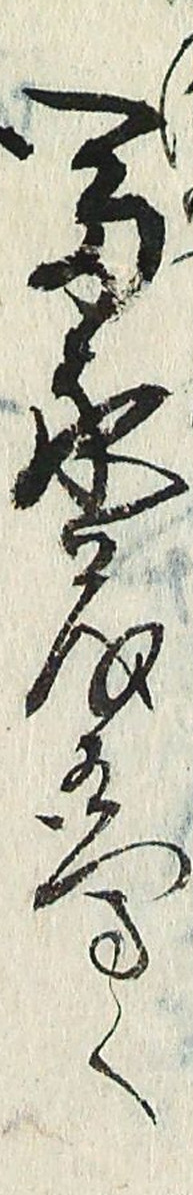富永茂右衛門方へ
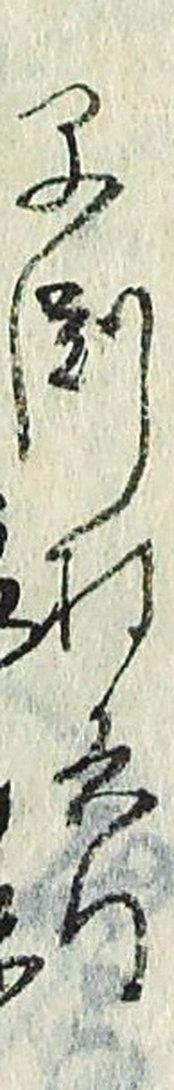早淵村右同
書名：公辺御役人為御廻浦御立越諸御用一巻
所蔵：鳴門教育大学 Naruto University of Education
